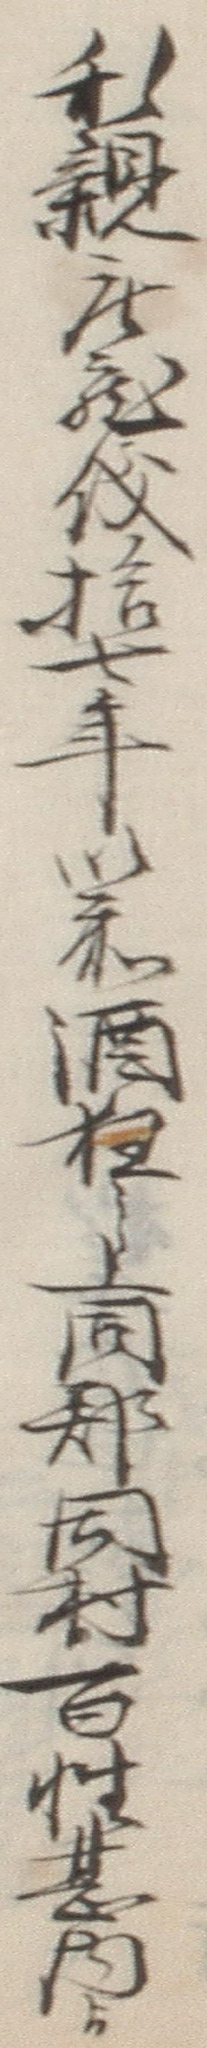私親庄蔵儀拾七年以前酒狂之上同郡同村百姓甚内と
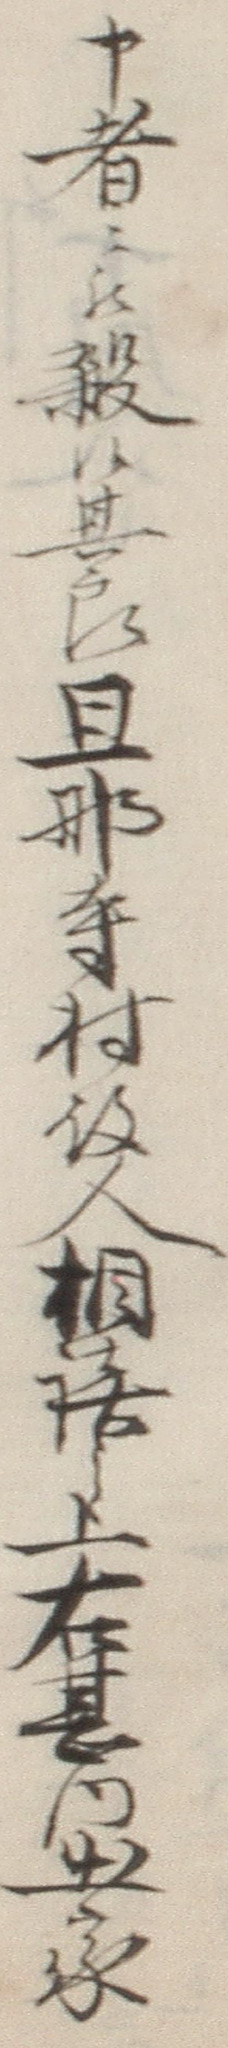申者ニ被殺候其節旦那寺村役人相談之上右甚内出家
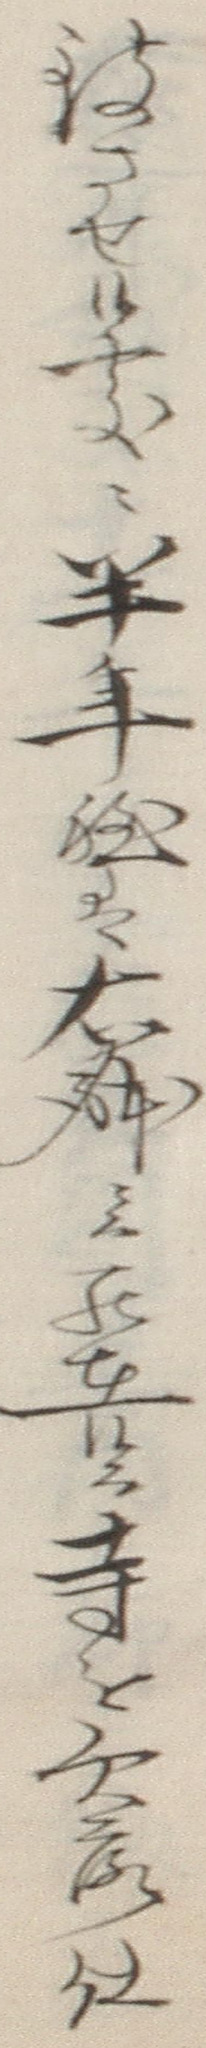致させ候処ニ半年程は右躰ニ而罷在候而寺を欠落仕
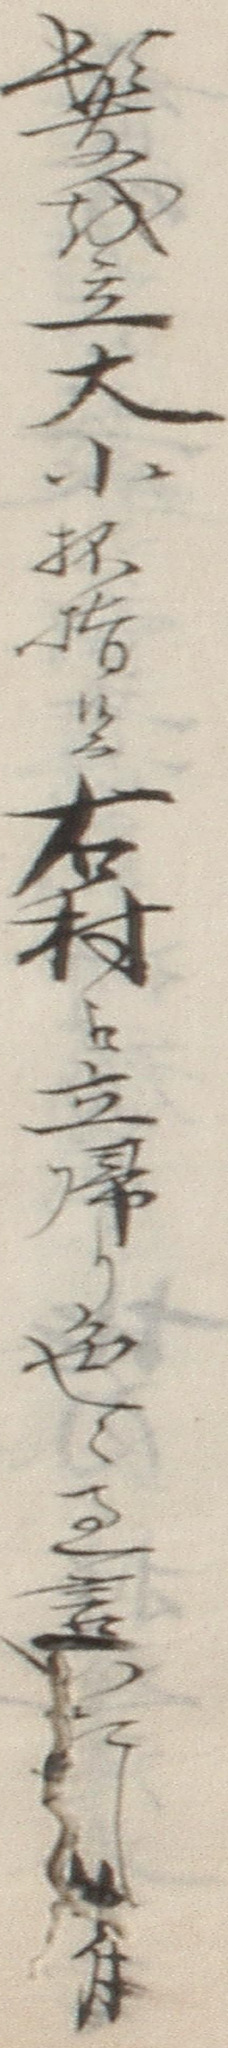髪を立大小抔指候而右村え立帰り色々過言いたし候ニ付
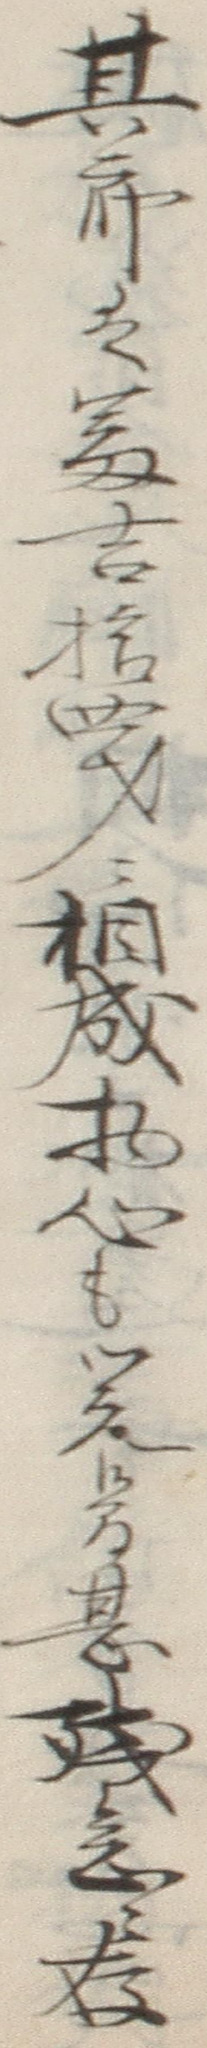其節は富吉拾四才ニ相成物心も覚候間甚残念ニ存
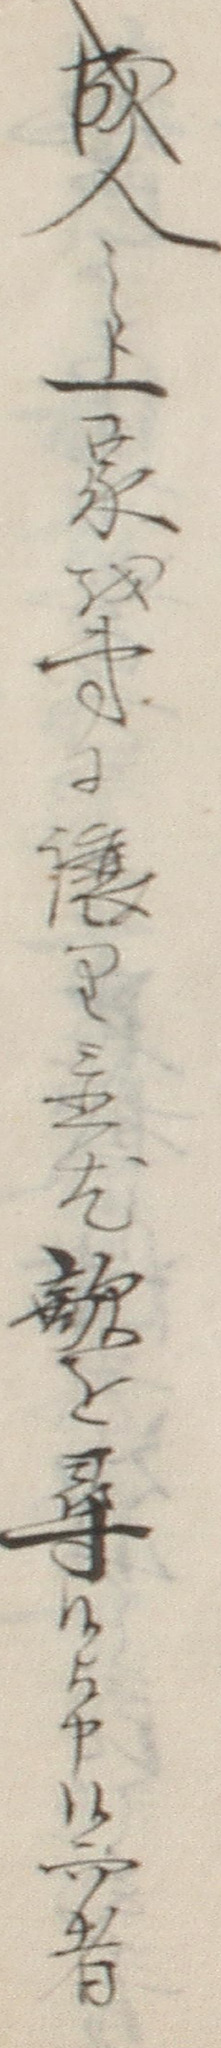成人之上家を弟に譲り置尤敵を尋候と申候而は
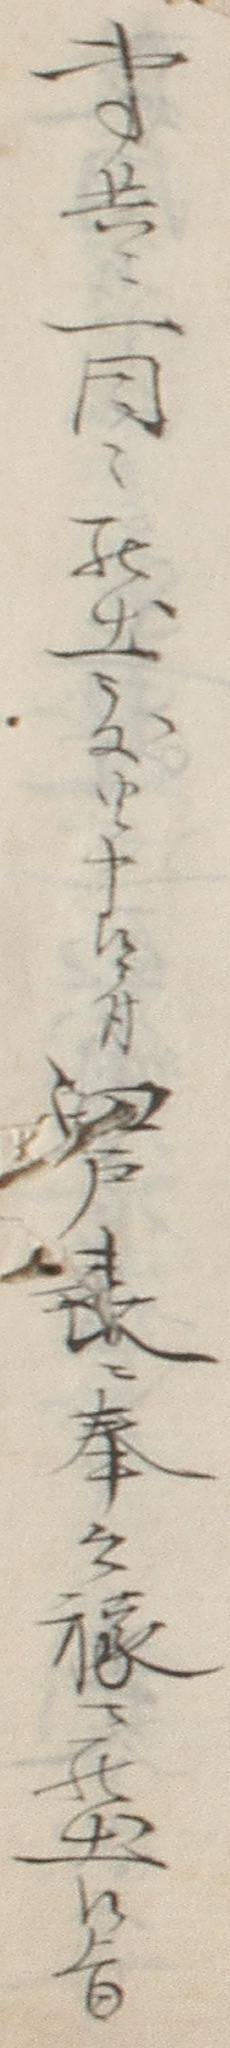弟共ニ一同ニ罷出度由申候ニ付江戸表ニ奉公稼可罷出候旨

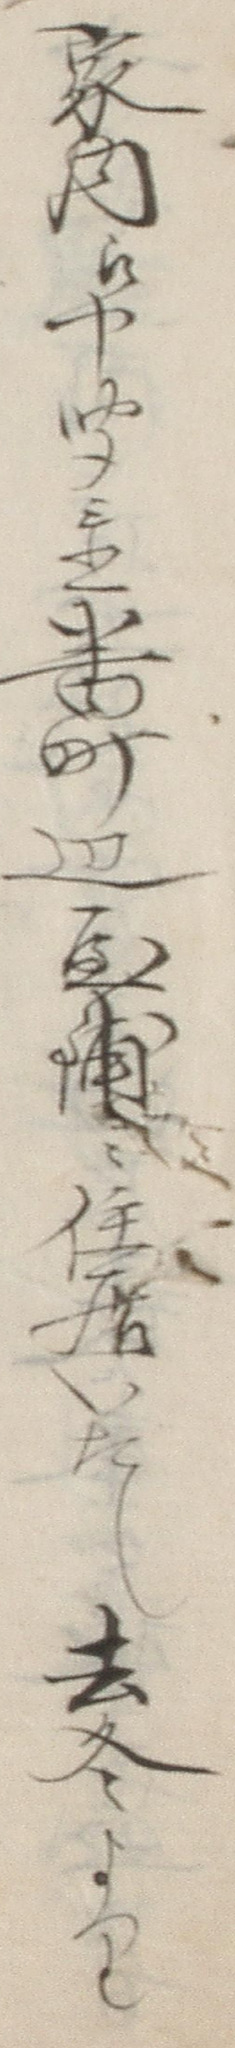家内え申聞置番町辺屋鋪ニ住居いたし去冬より
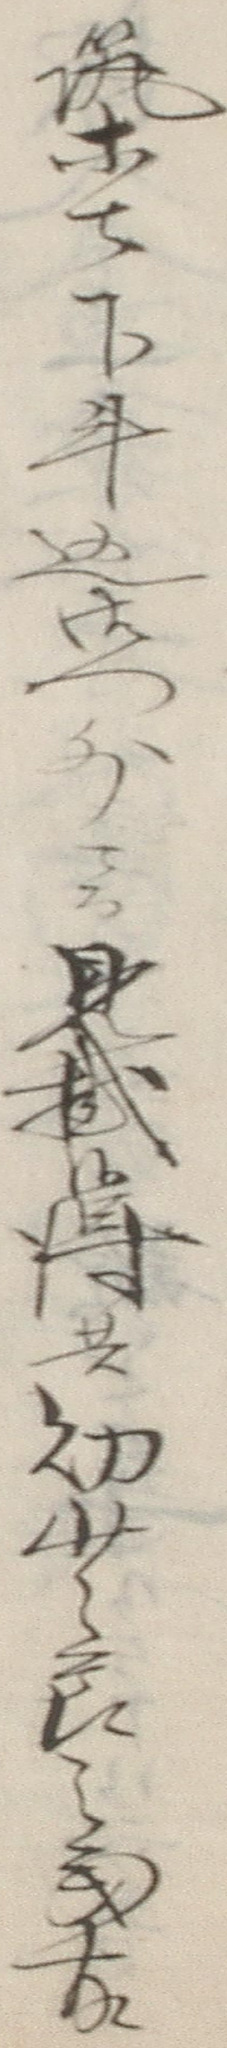築土下牛込御門外ニ而見掛候得共幼少之節之義故
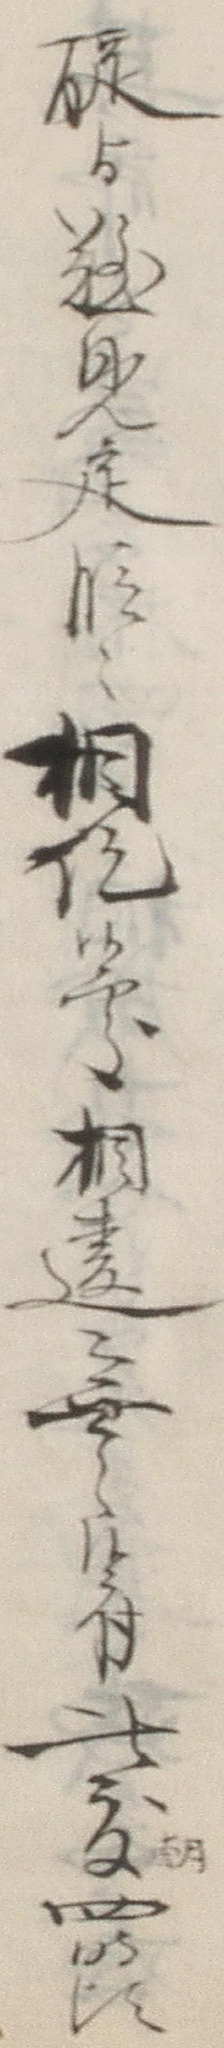碇と難見定段之相糾候処相違ニ無之候ニ付此度四時頃
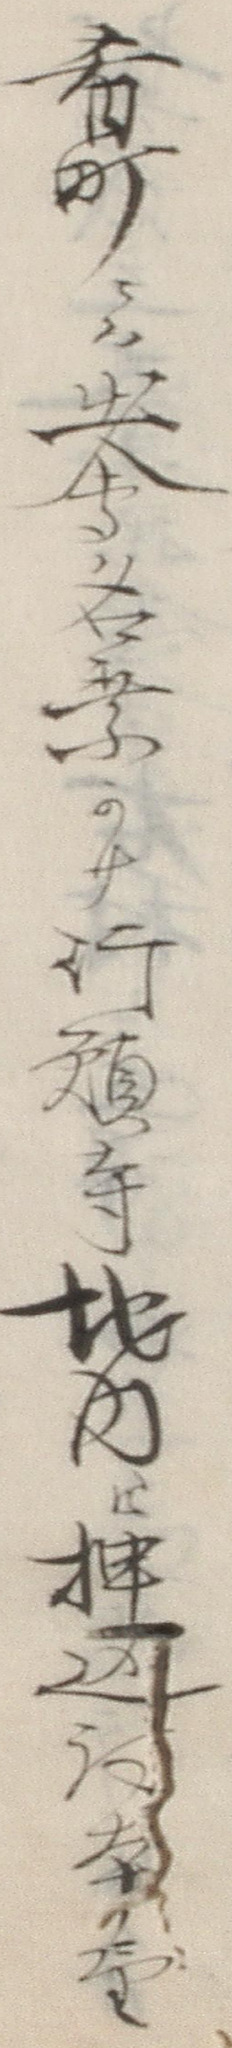肴町ニ而出会名乗可申行願寺地内え押込敵討の望
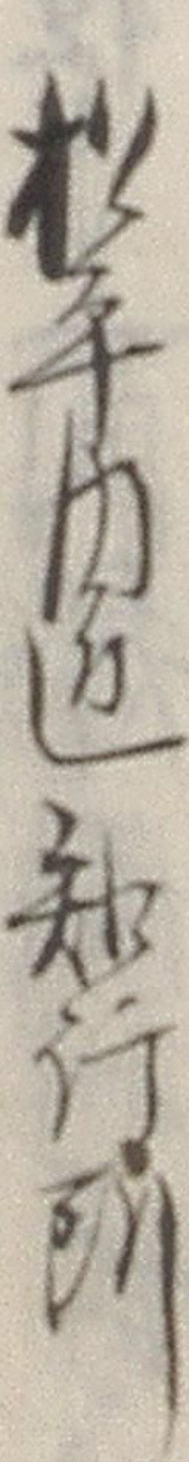松平内匠知行所
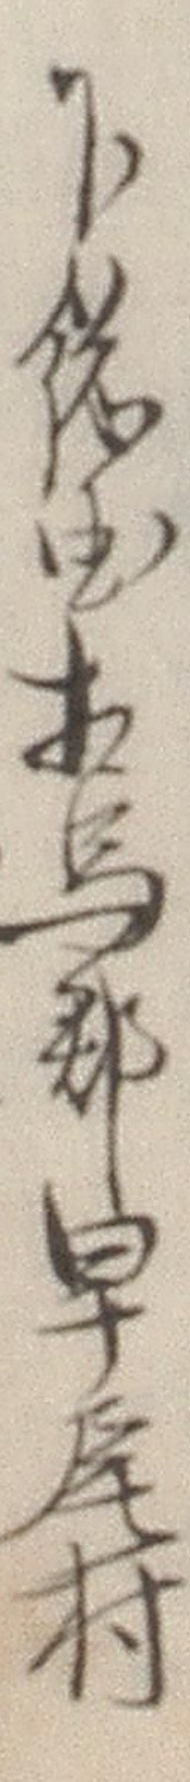下総国相鳥郡早尾村
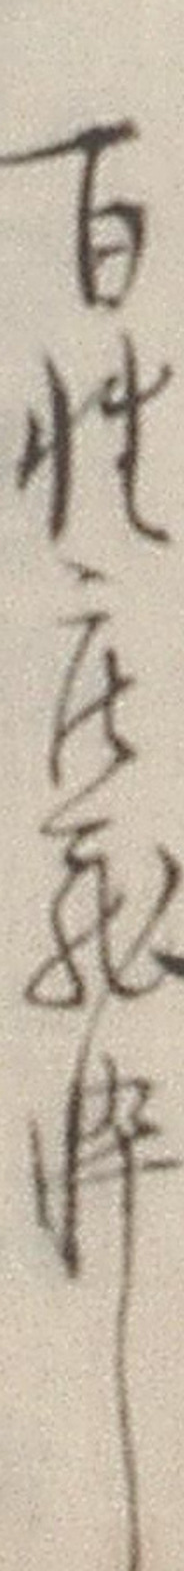百姓庄蔵倅
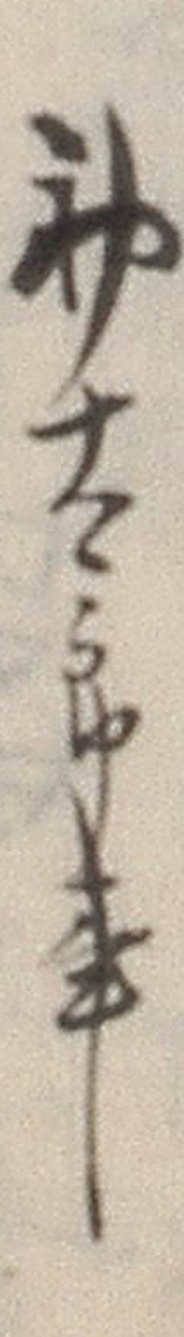初太郎事
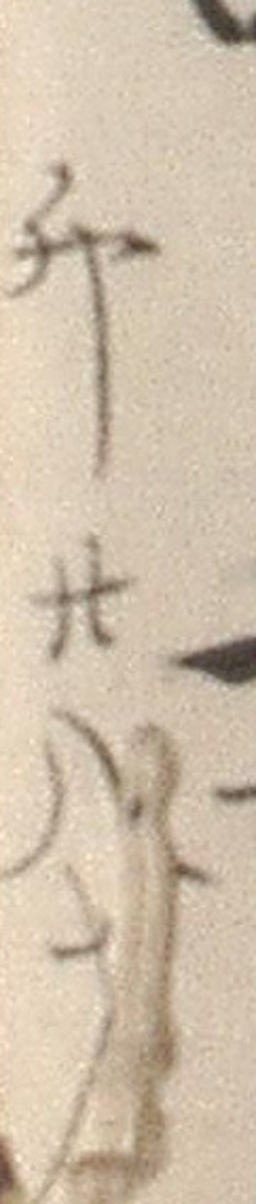卯廿八才
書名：[諸国災害記録]
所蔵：東京大学地震研究所図書室 Earthquake Research Institute Library, The University of Tokyo, JAPAN
